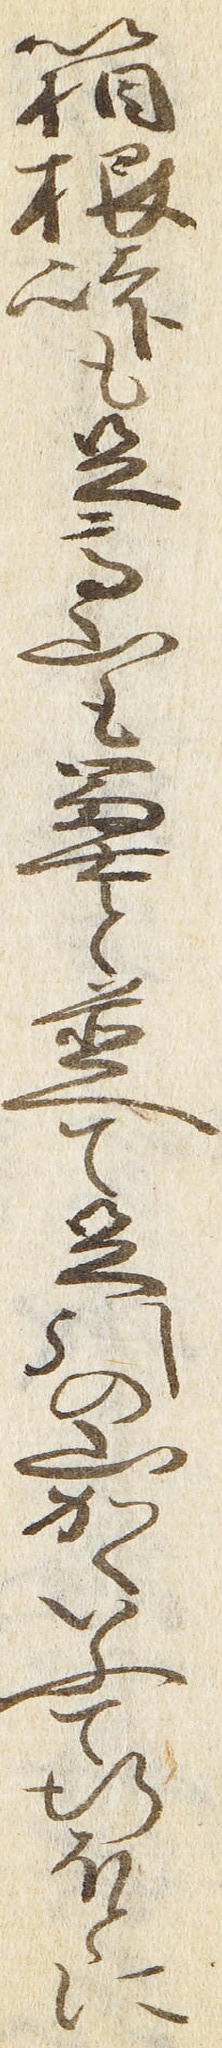箱根峠も足高山も富士と並へて足引の山かくいふて行ほとに
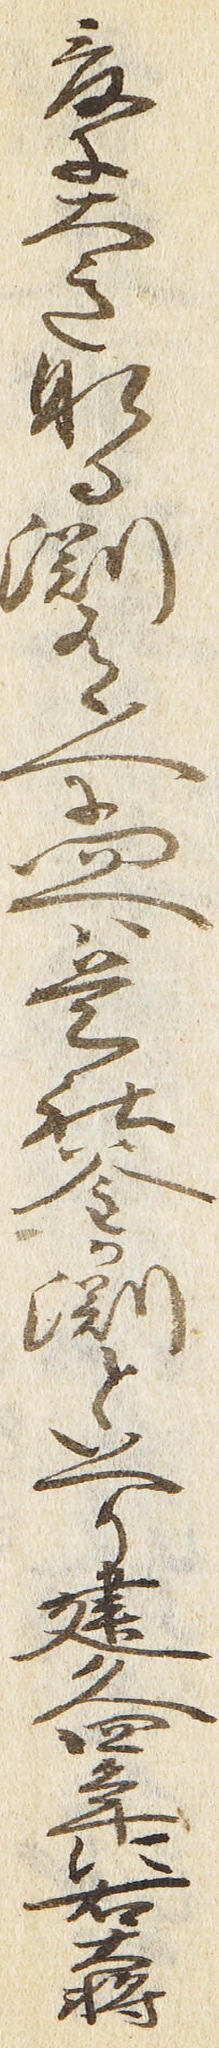爰に大きなる渕有人に問へは是社釜か渕といへり建久四年に右大将
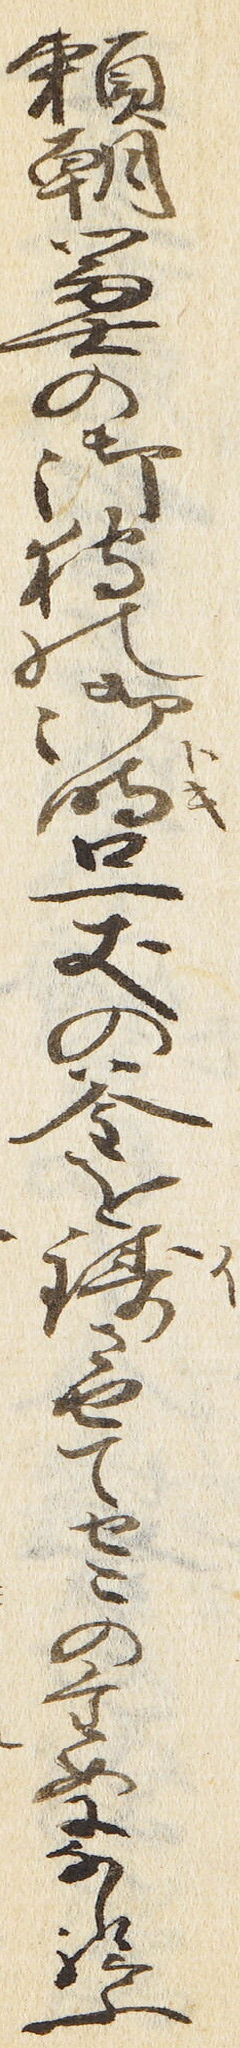頼朝富士の御狩の御時口一丈の釜を鋳させてせこのためになし給ふ
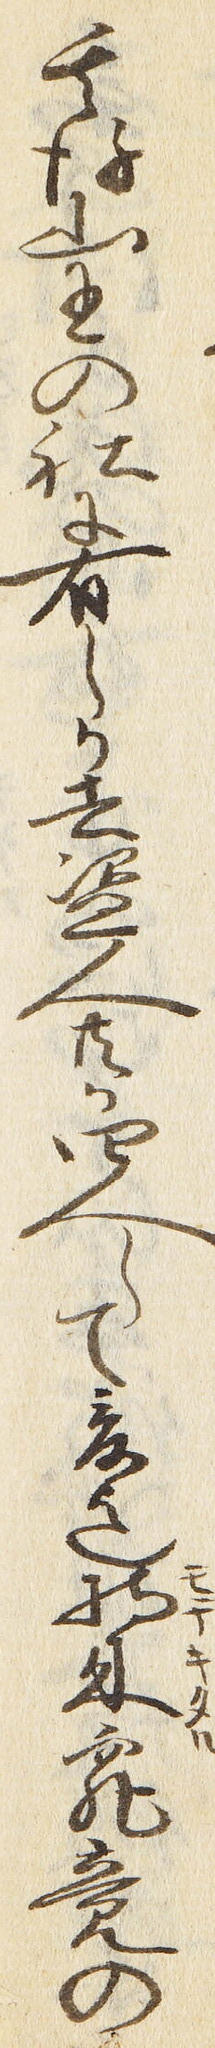其後山王の社に有しか去盗人共か四人して爰迄持来究竟の
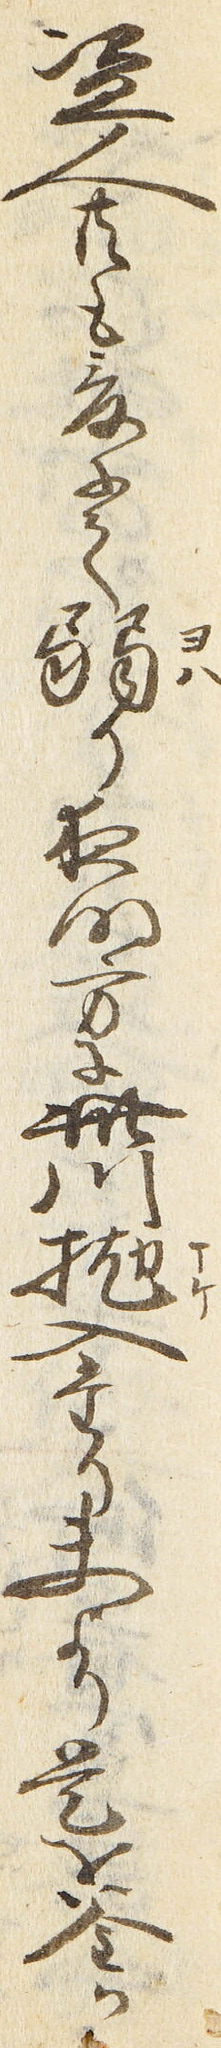盗人共も爰にて弱り夜明方に此川抛入たり夫より是を釜か
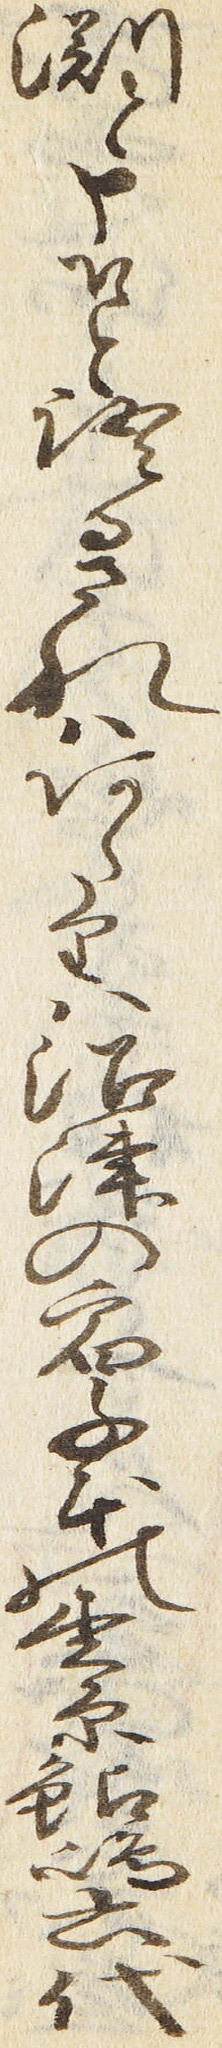渕と申そと語るされはあたりは沼津の宿千本の松原鮎嶋六代
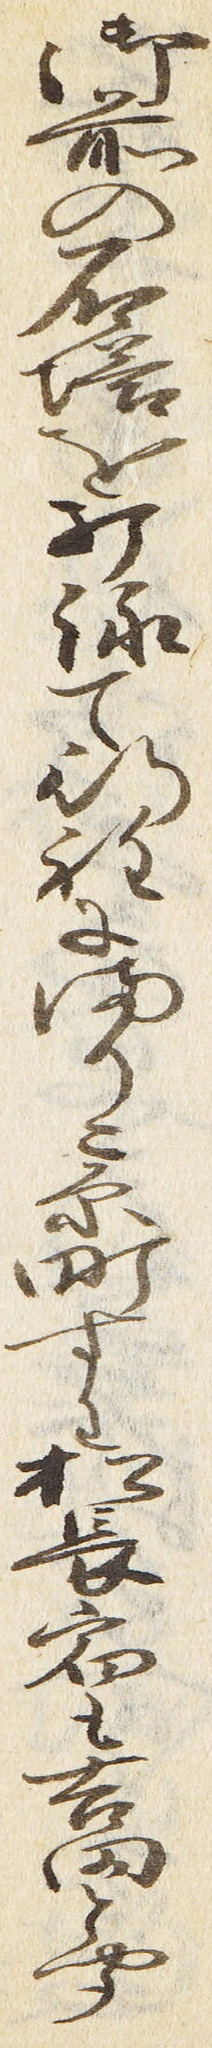御前の石塔を打詠て行程にまりこ原町すわ松長宿も吉田と聞
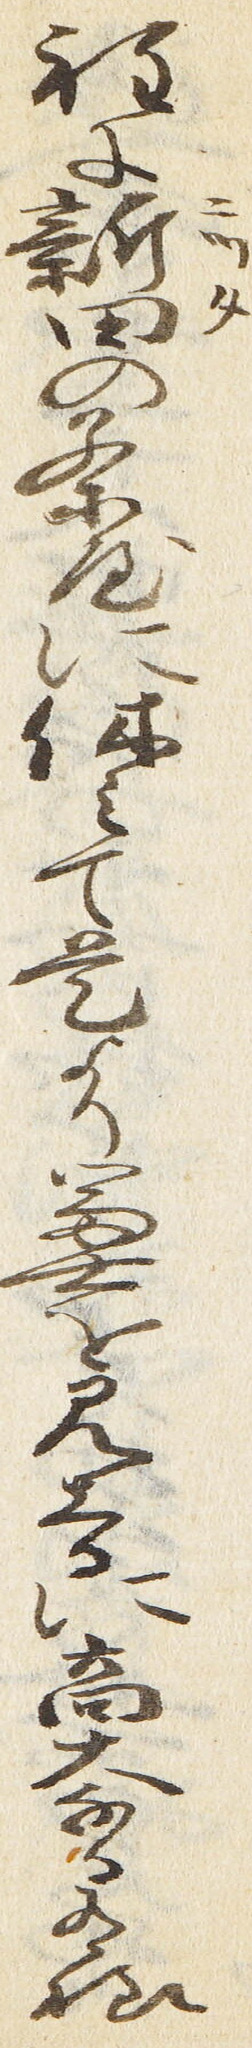程に新田の茶屋に休みて是より富士を見上るに高大なる有様
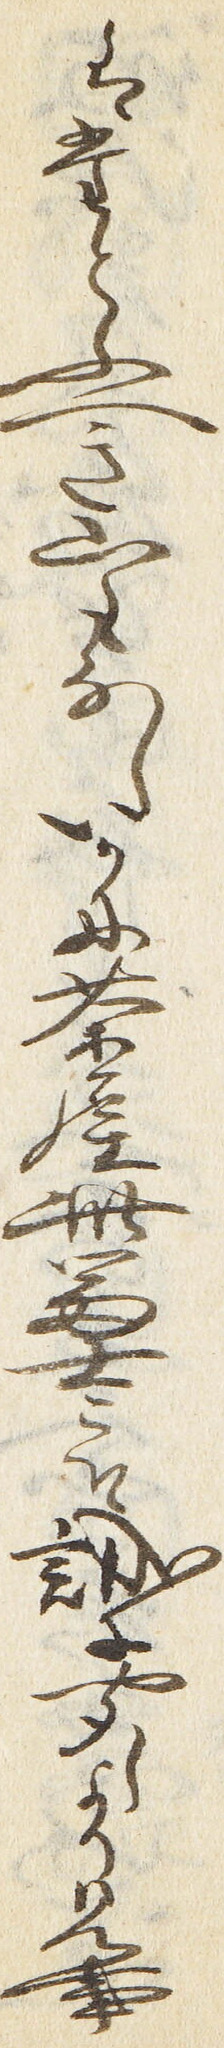はたとふへき山もなしいかに茶屋此富士こそ誠に聞しより見事
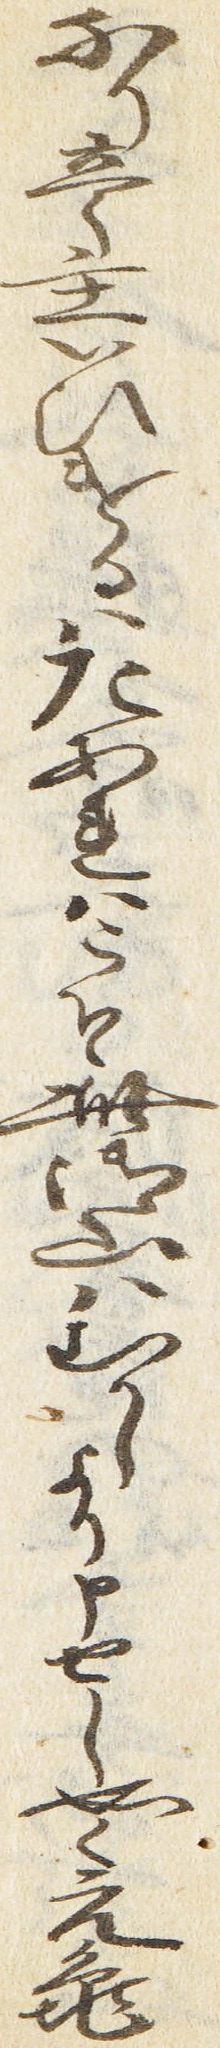なり亭主いひけるは左あれはこそ此御山はむかしより申せし如く元亀
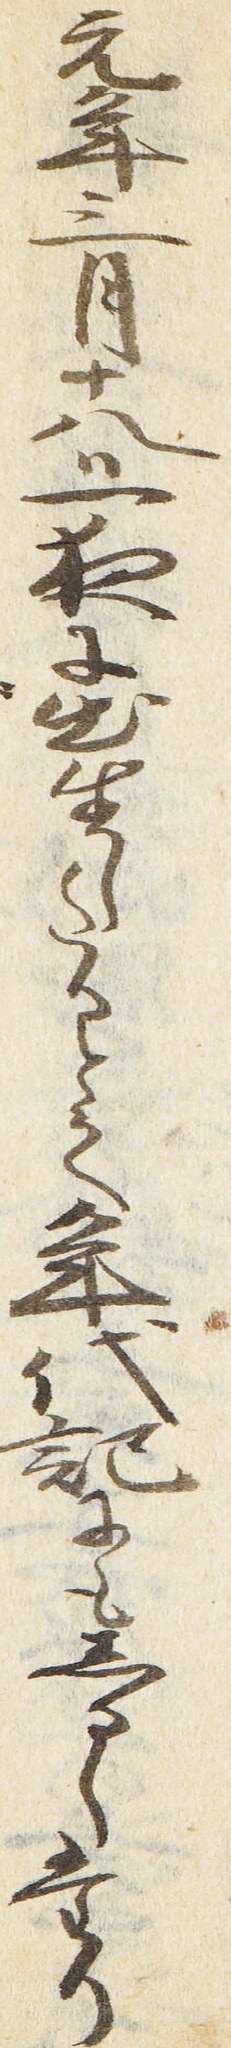元年三月十八日一夜に出生したるとて年代記にもしるしたり
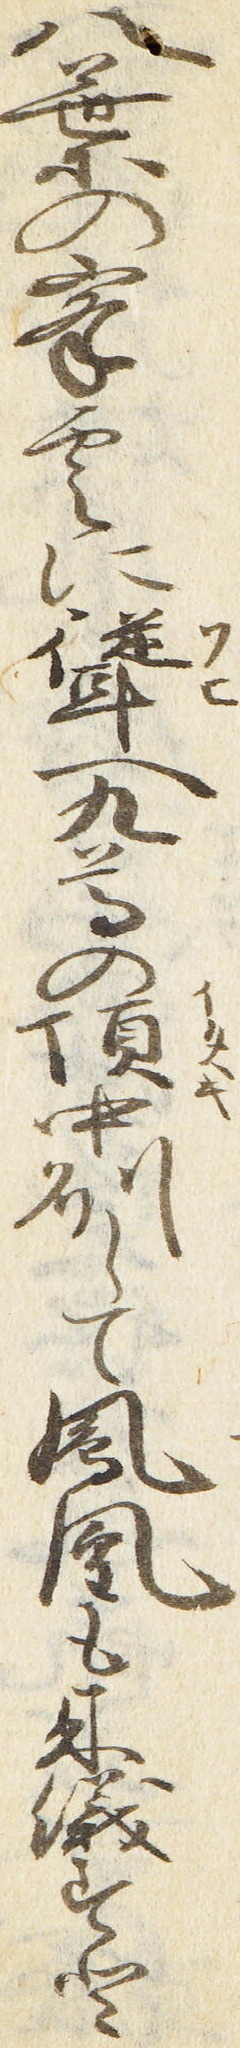八葉の峯雲に聳へ九尊の頂中別して鳳凰も来儀すと
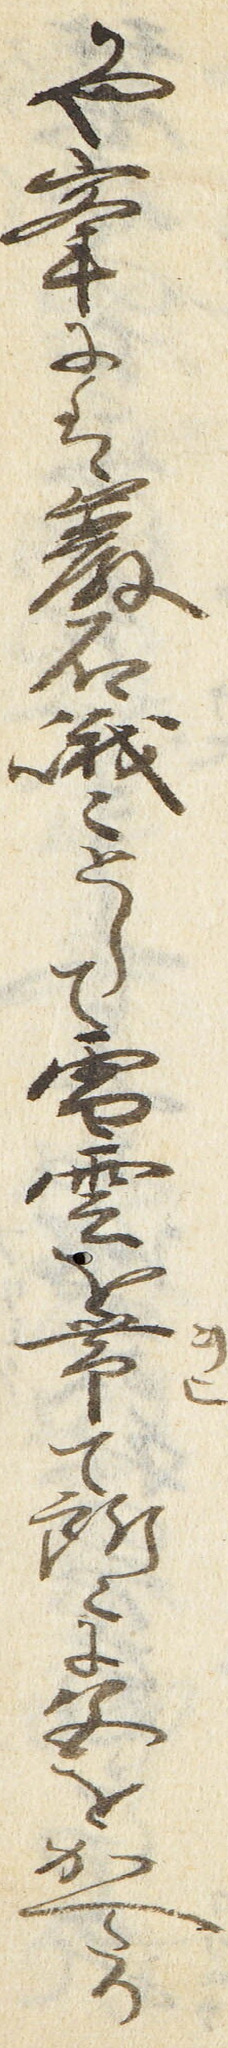かや峯には巌石峨々として雪雲を帯て所々に色をかへたり

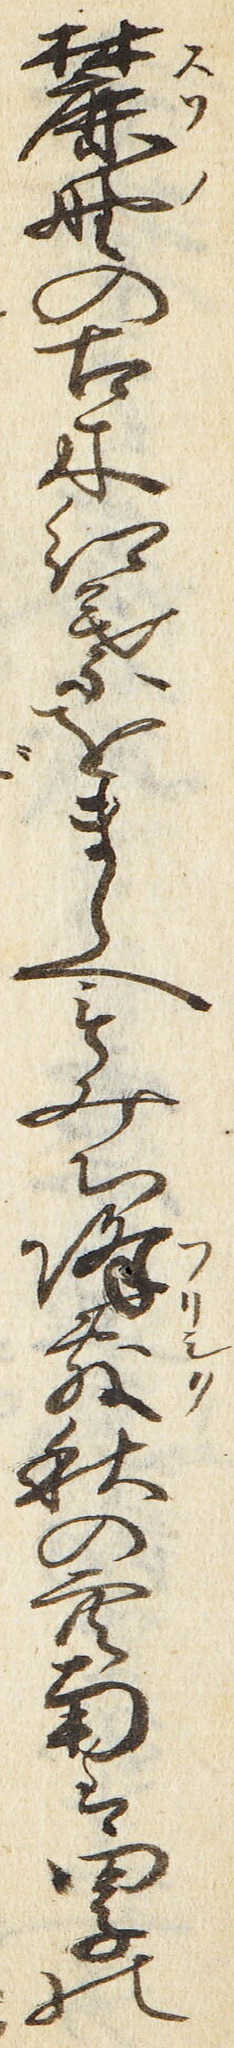麓野の古木紅葉をましへもみち降敷秋の空南は田子の
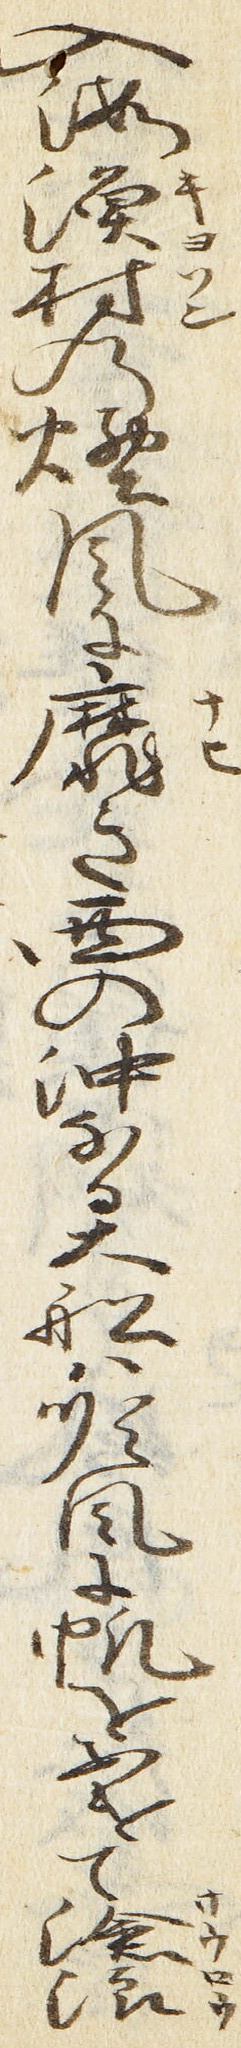入海漁村の煙風に靡き西の沖なる大船は順風に帆をあけて滄浪
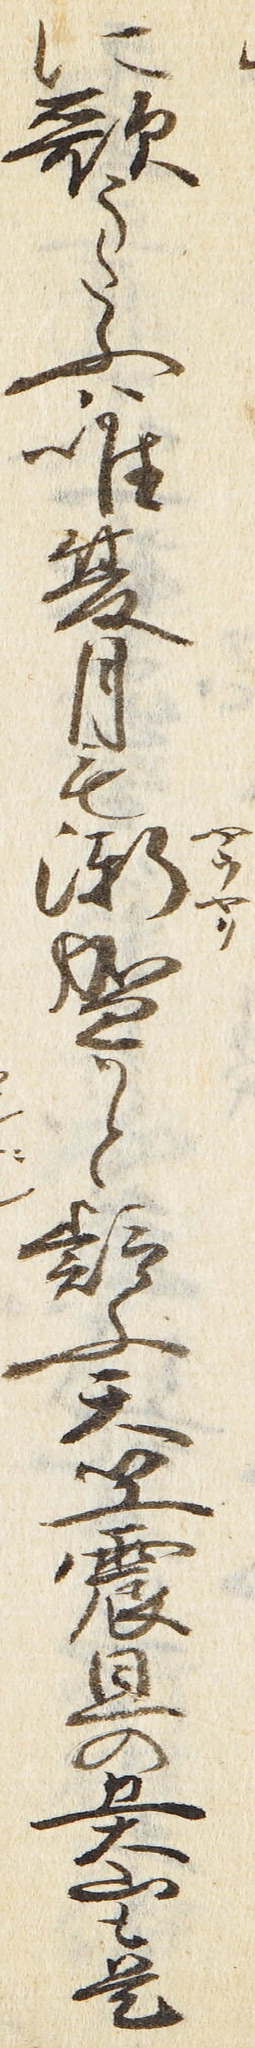に歌うたふは唯夏月も漸盛かと疑ふ天竺震旦の五大山も是
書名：海陸世話日記
